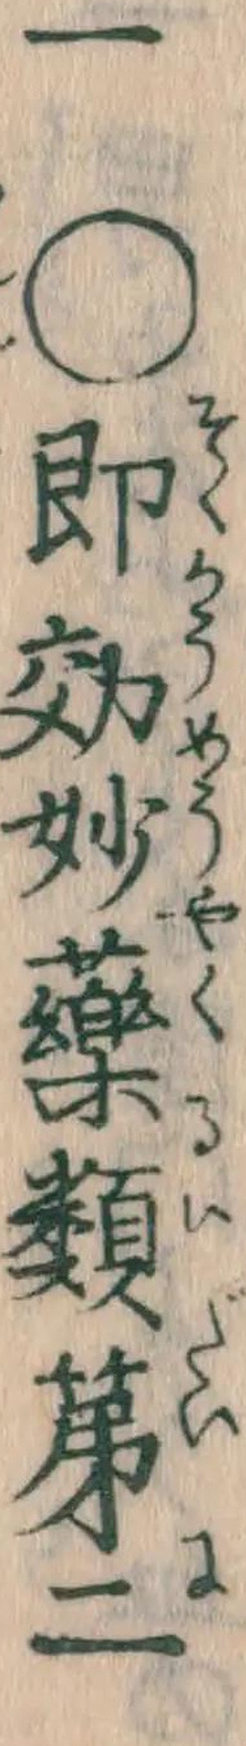一○即効妙薬類第二
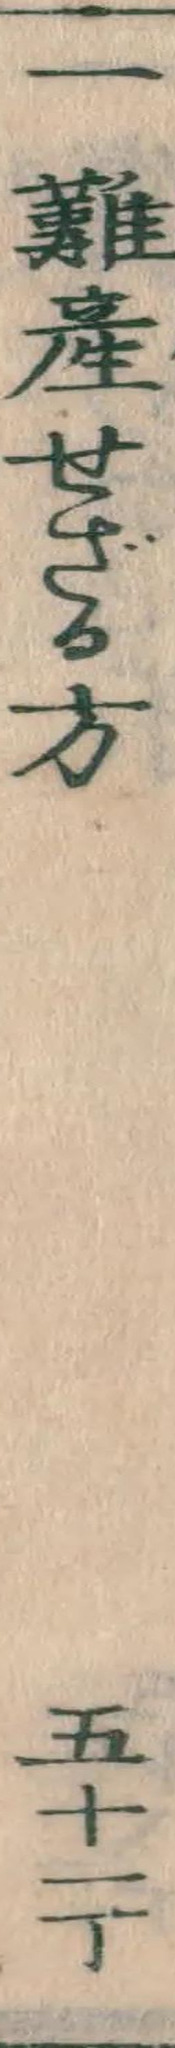一難産せざる方五十一丁
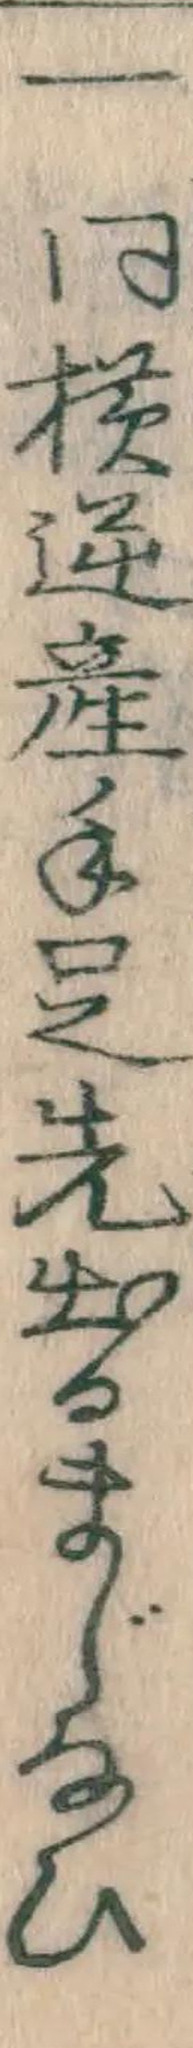一同横逆産手足先出るまじなひ
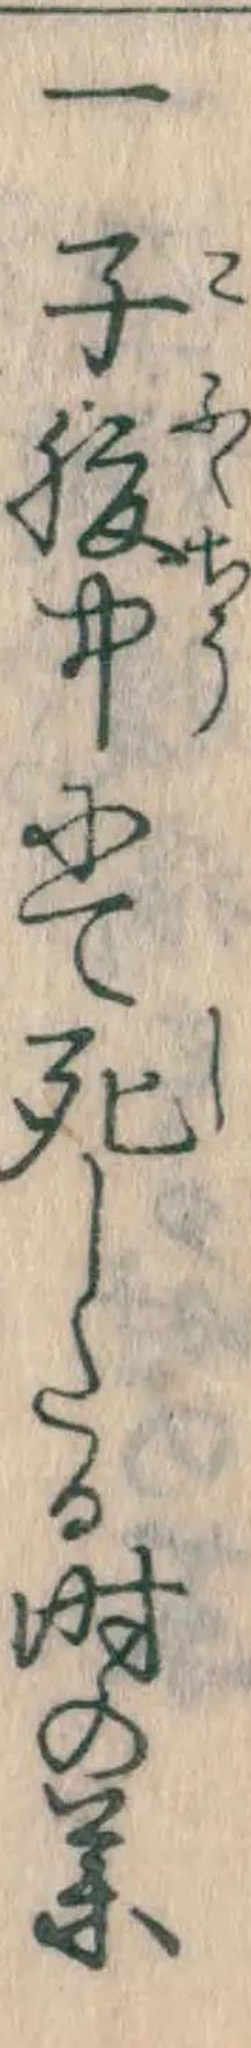一子腹中にて死したる時の薬
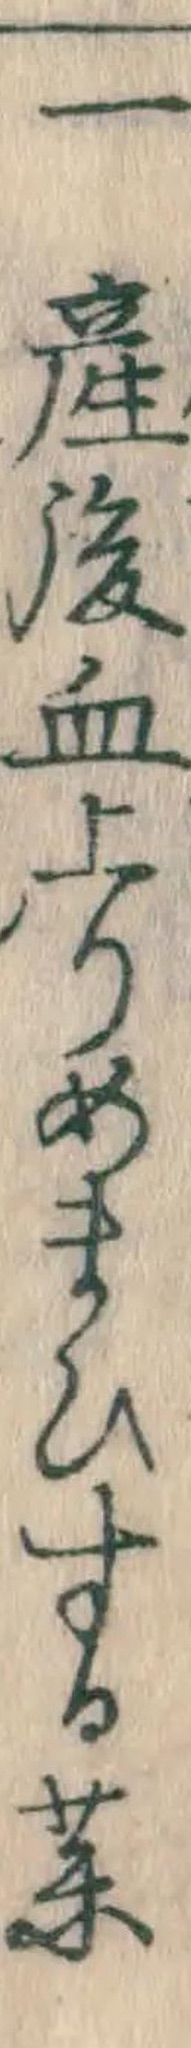一産後血上りめまひする薬
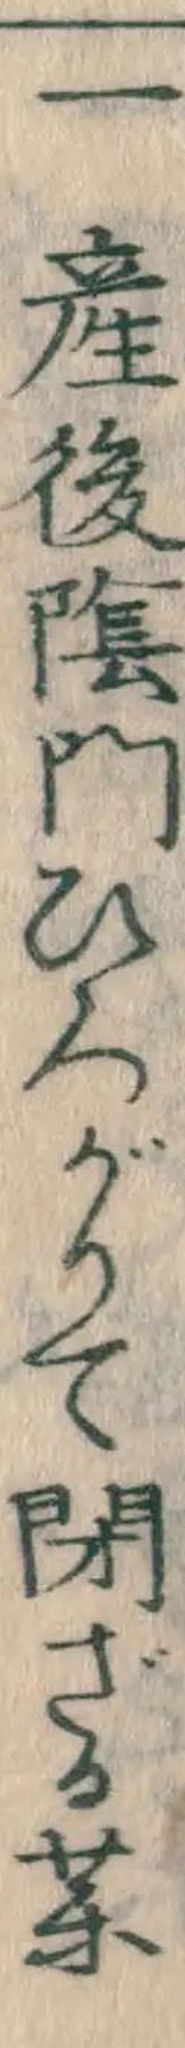一産後陰門ひろがりて閉ざる薬
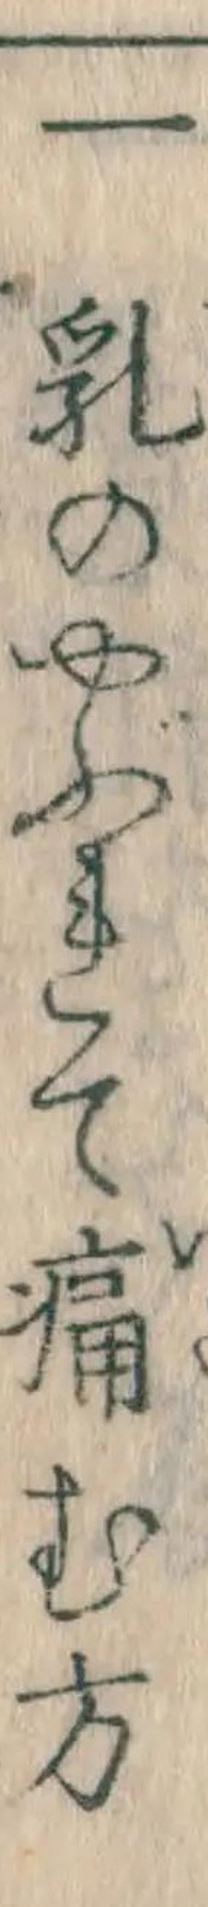一乳のやぶれて痛む方
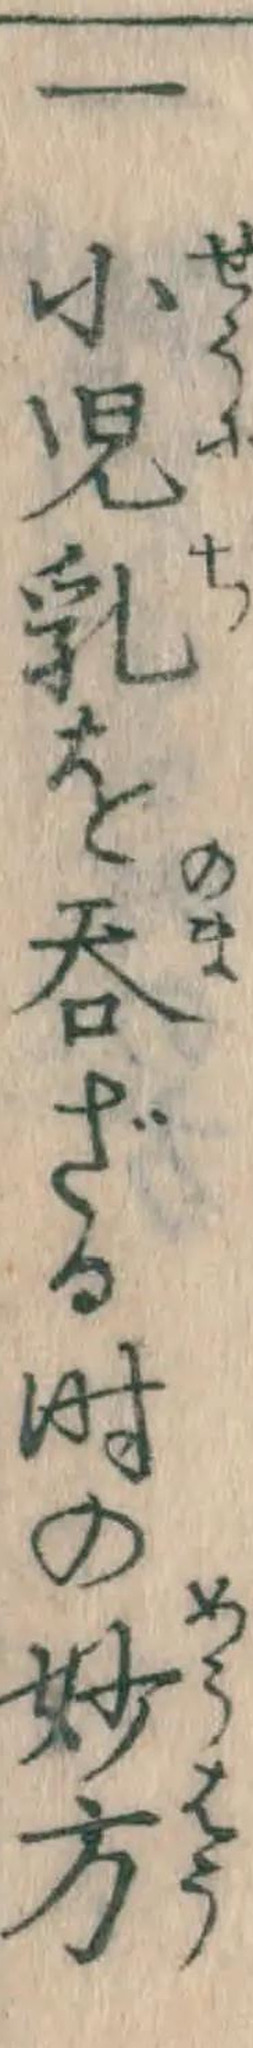一小児乳を呑ざる時の妙方

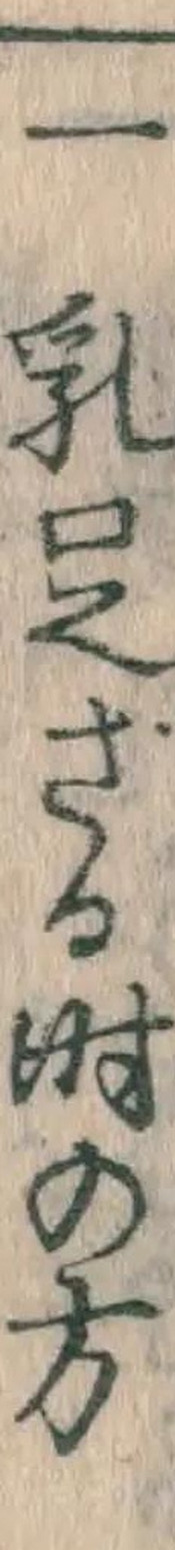一乳足ざる時の方
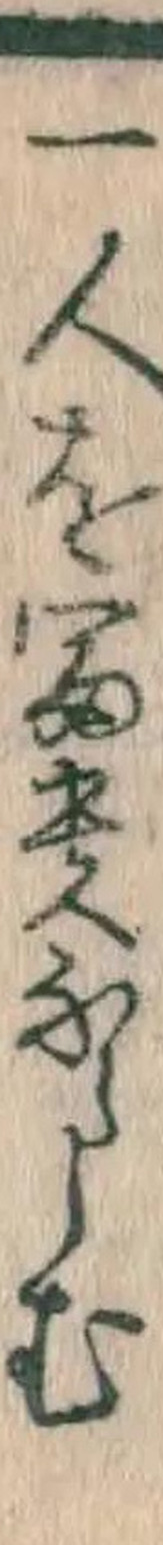一人を富貴ならしむ
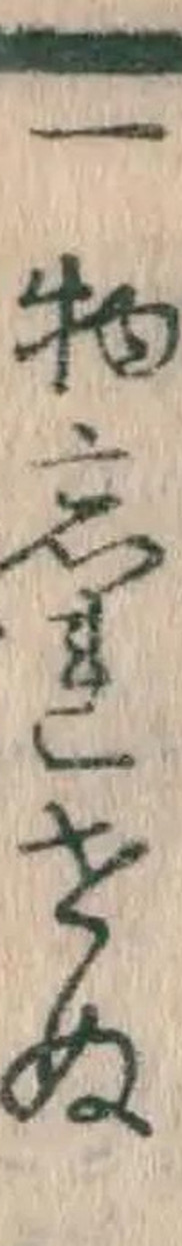一物忘れせぬ
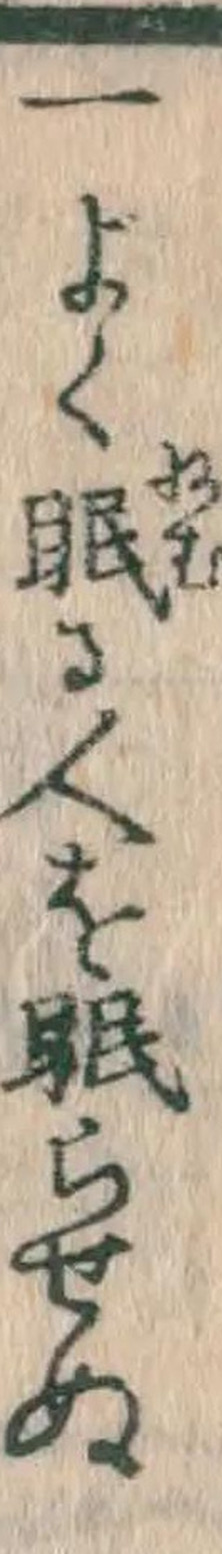一よく眠る人を眠らせぬ
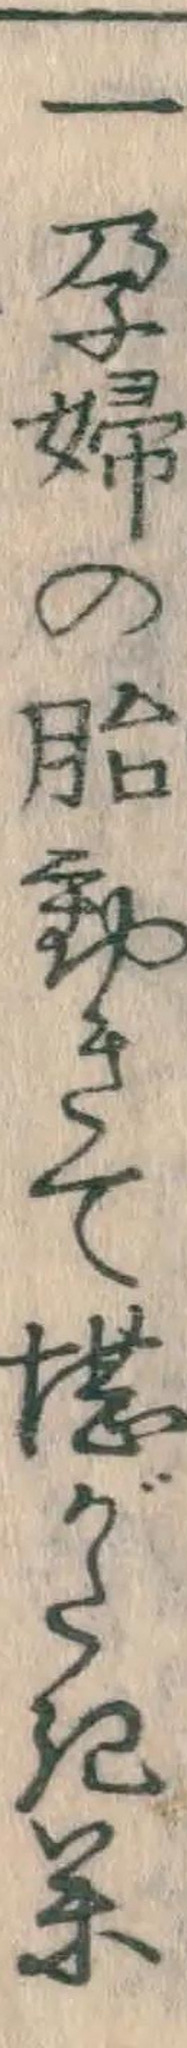一孕婦の胎動きて堪がたき薬
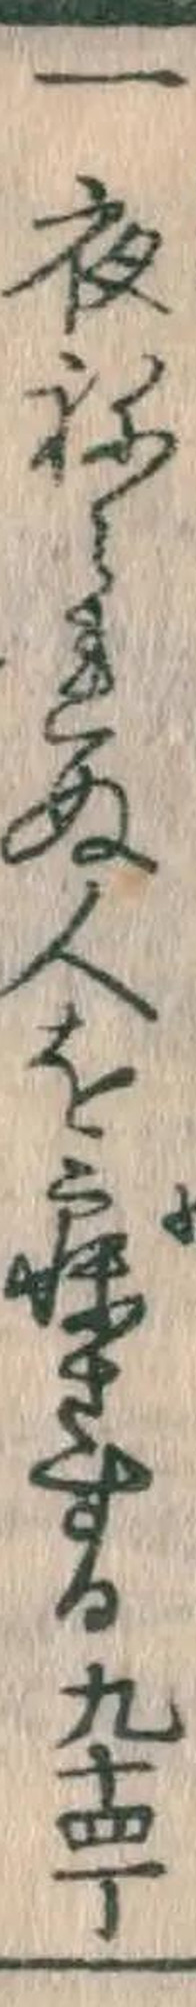一夜ねられぬ人を寝さする九十四丁
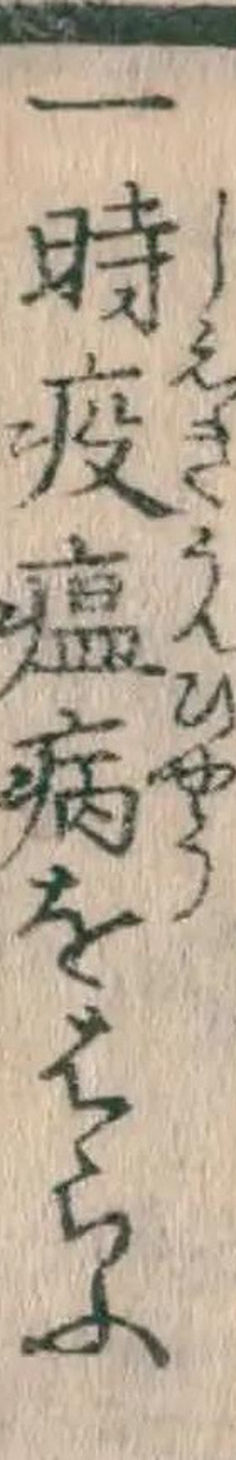一時疫瘟病をはらふ
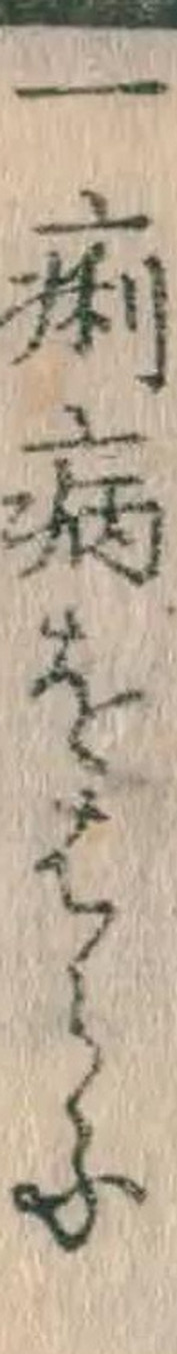一痢病をはらふ
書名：広益秘事大全 3巻. [1]
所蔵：国立国会図書館 National Diet Library, JAPAN
